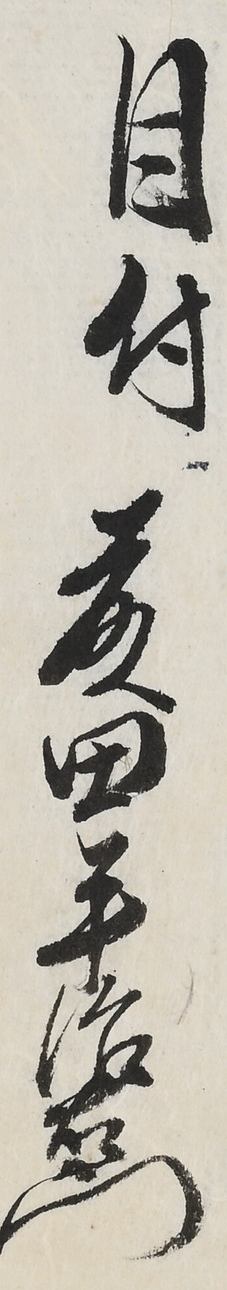目付藤田平治右衛門
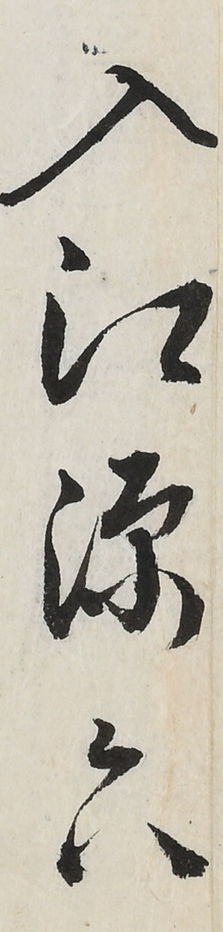入江源六
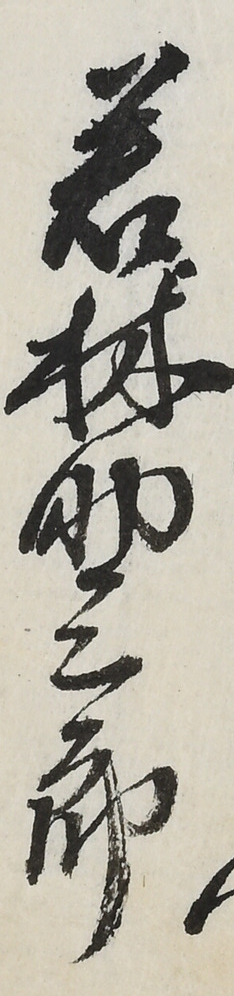若林助三郎
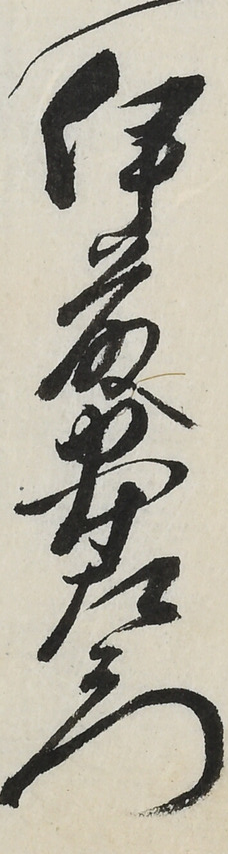伊藤安左衛門
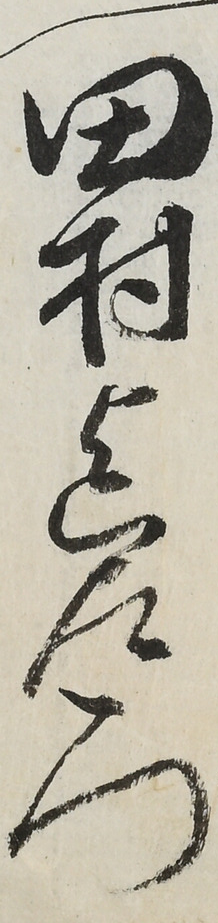田村真左衛門

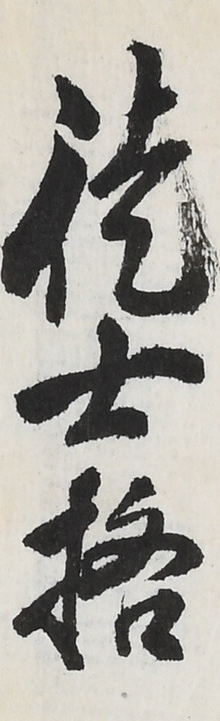徒士格
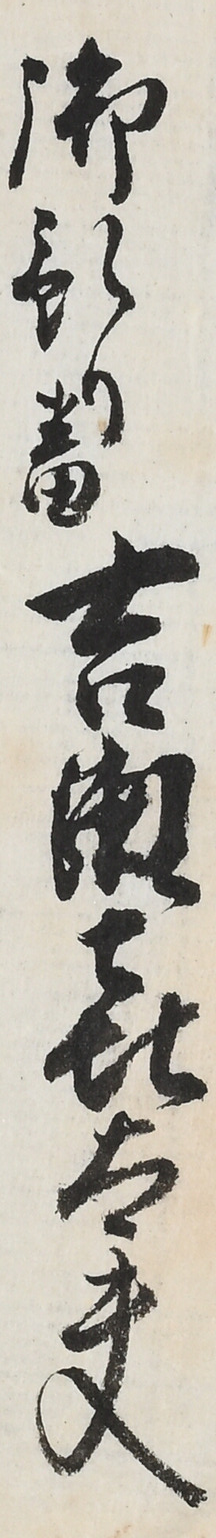御預り番吉瀬喜太夫
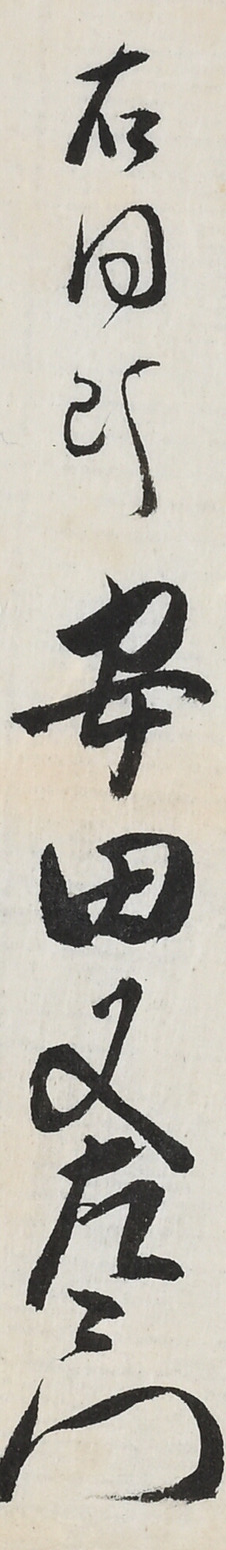右同断安田又左衛門
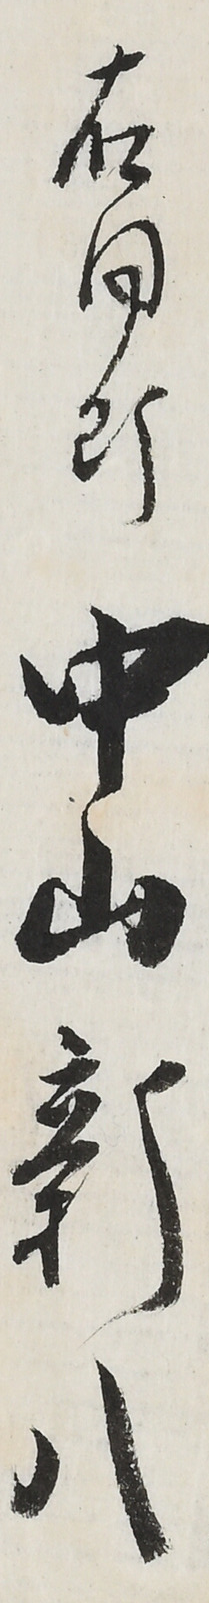右同断中山新八
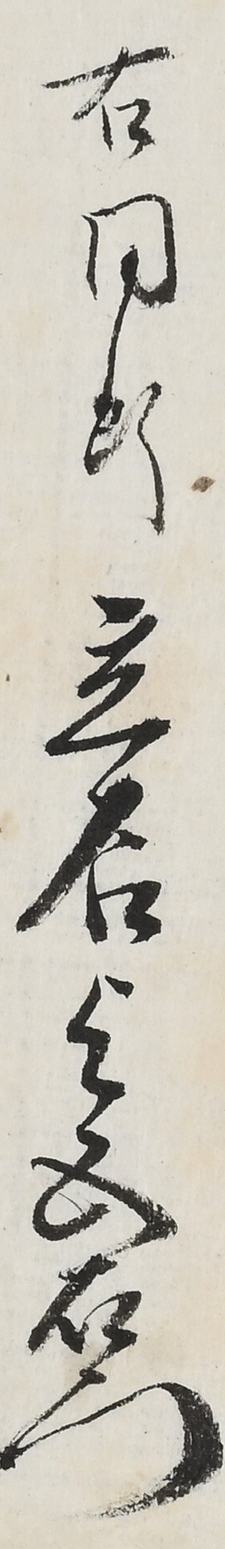右同断立石与五右衛門
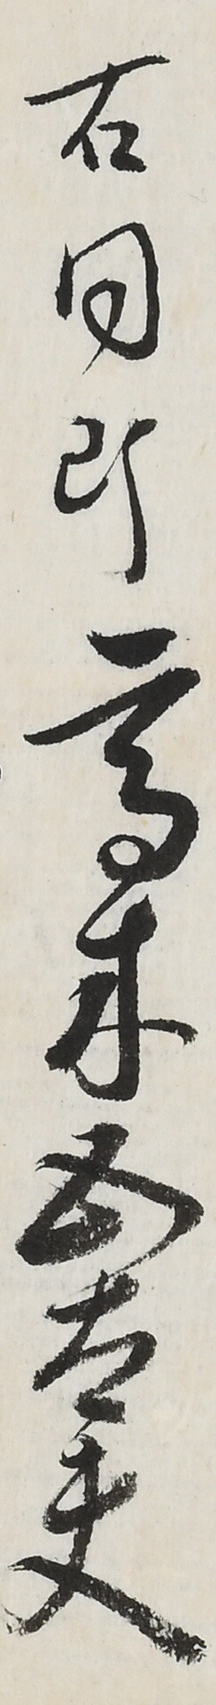右同断高木五太夫
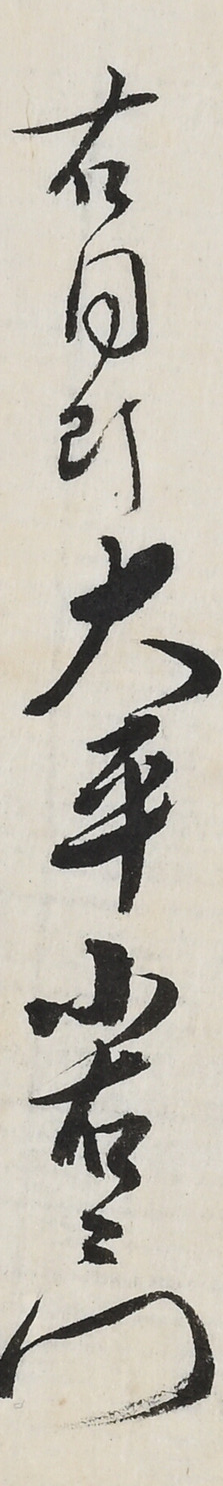右同断大平小右衛門
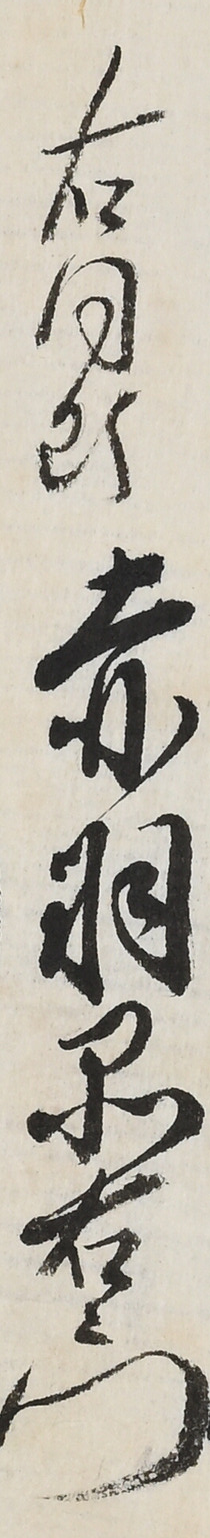右同断赤羽品右衛門
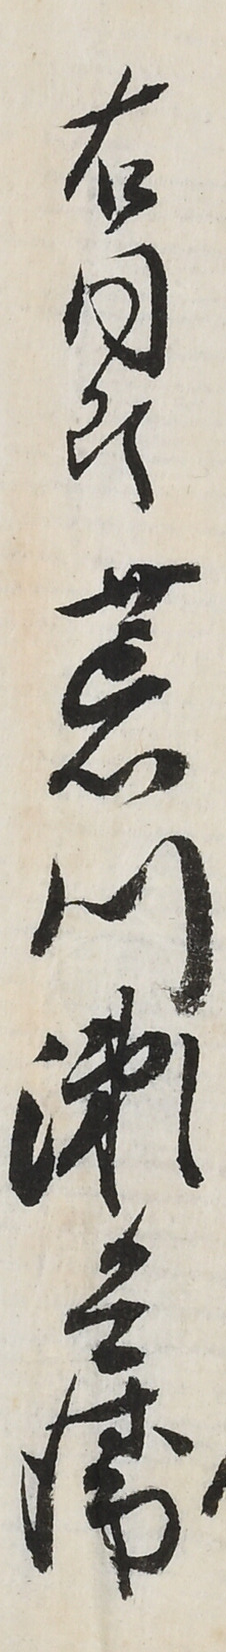右同断荒川瀬兵衛
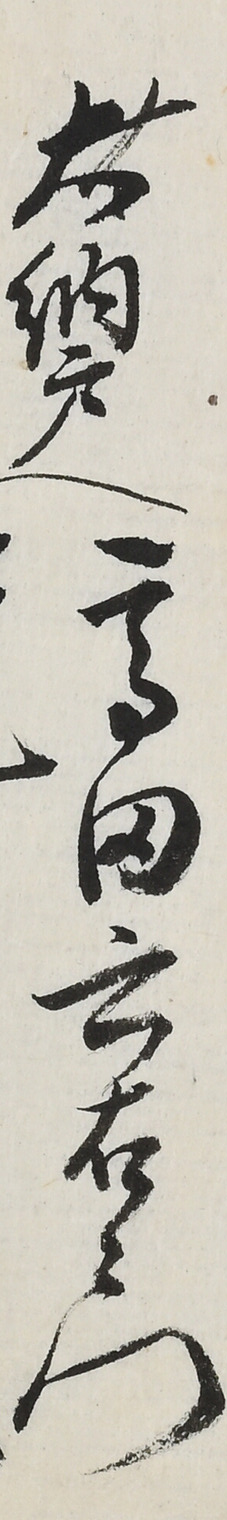大納戸高田六右衛門
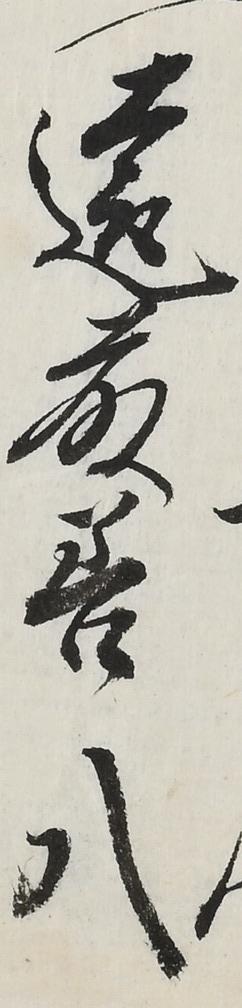遠藤善八
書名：高遠江戸徒以上之面々
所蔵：伊那市立高遠町図書館・合同会社AMANE
